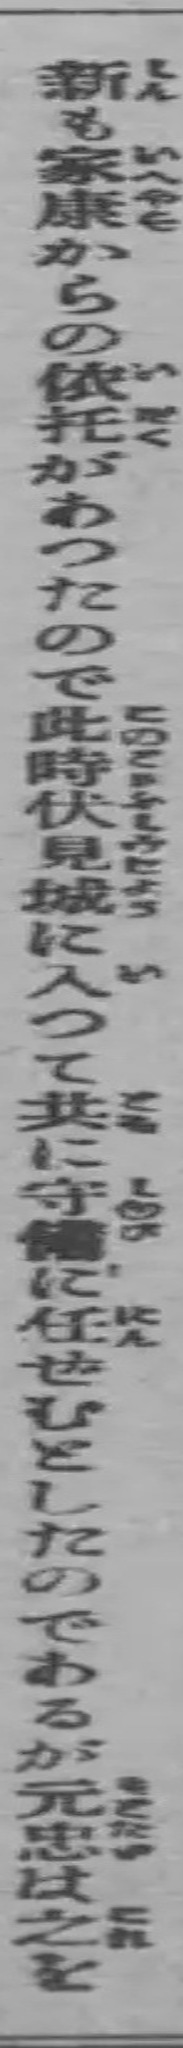むと請ふ新も家康からの依托があつたので此時伏見城に入つて共に守備に任ぜむとしたのであるが元忠は之を
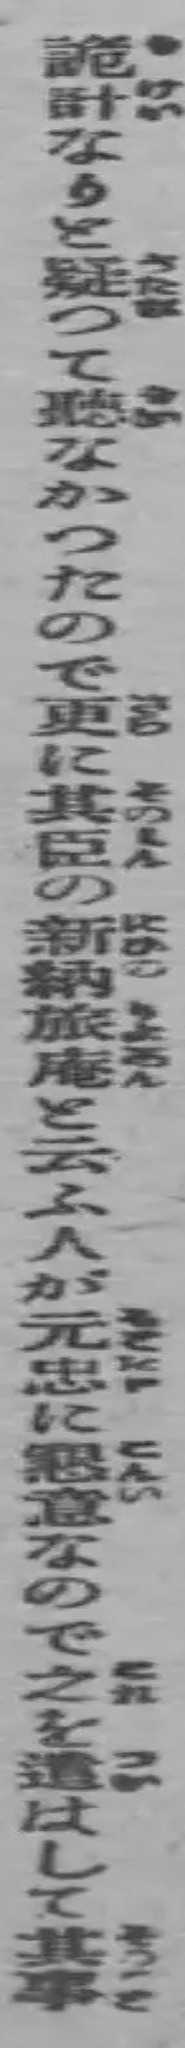詭計なりと疑つて聴なかつたので更に其臣の新納旅庵と云ふ人が元忠に懇意なので之を遣はして其事
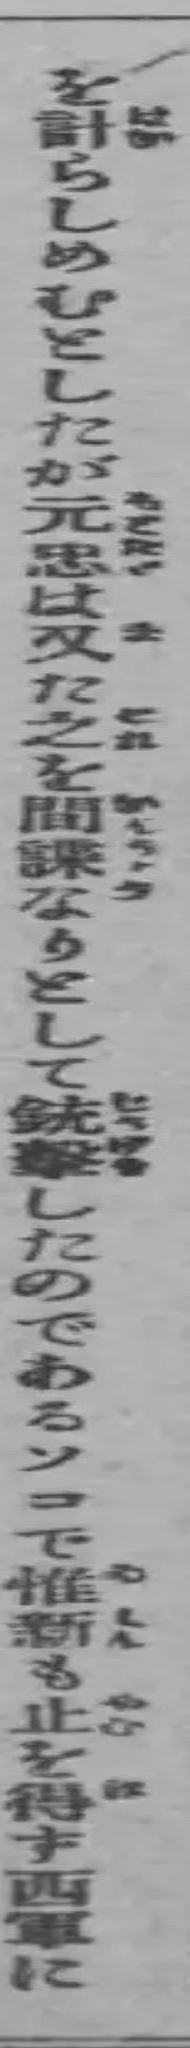を計らしめむとしたが元忠は又た之を間諜なりとして銃撃したのであるソコで惟新も止を得ず西軍に
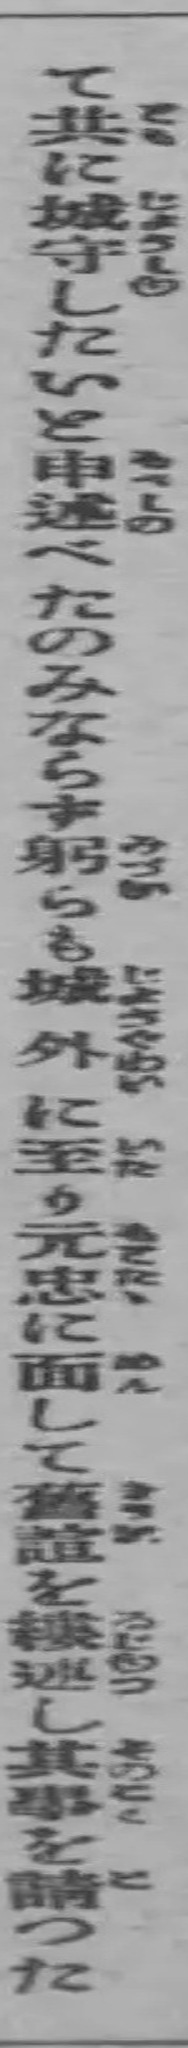請ふて共に城守したいと申述べたのみならず躬らも城外に至り元忠に面して旧誼を縷述し其事を請つた
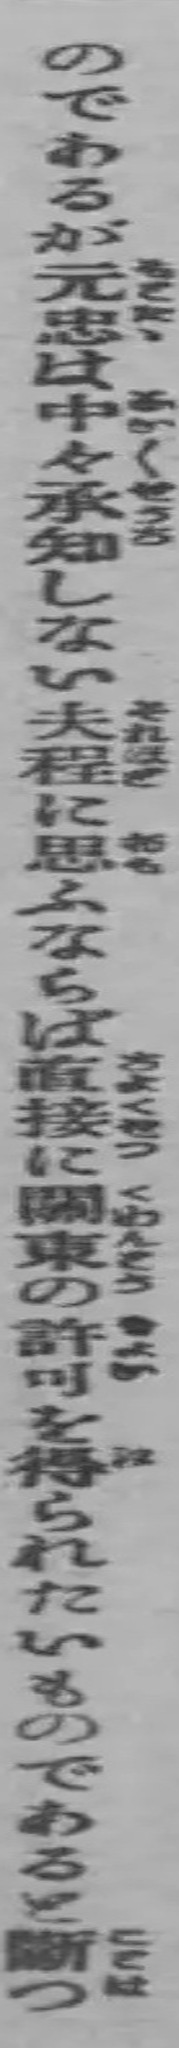のであるが元忠は中々承知しない夫程に思ふならば直接に関東の許可を得られたいものであると断つ
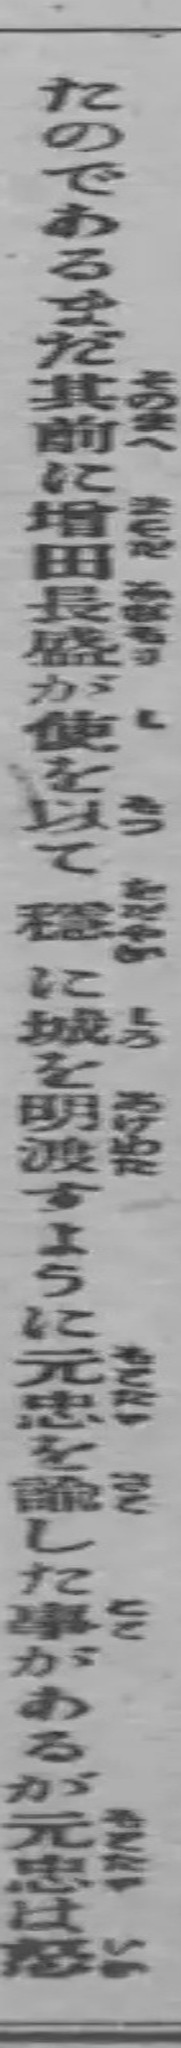たのであるまだ其前に増田長盛が使を以て穏に城を明渡すように元忠を諭した事があるが元忠は怒
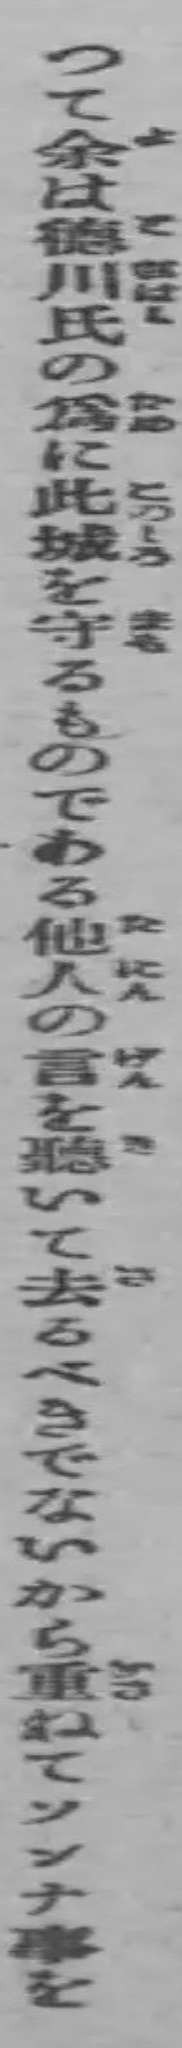つて余は徳川氏の為に此城を守るものである他人の言を聴いて去るべきでないから重ねてソンナ事を
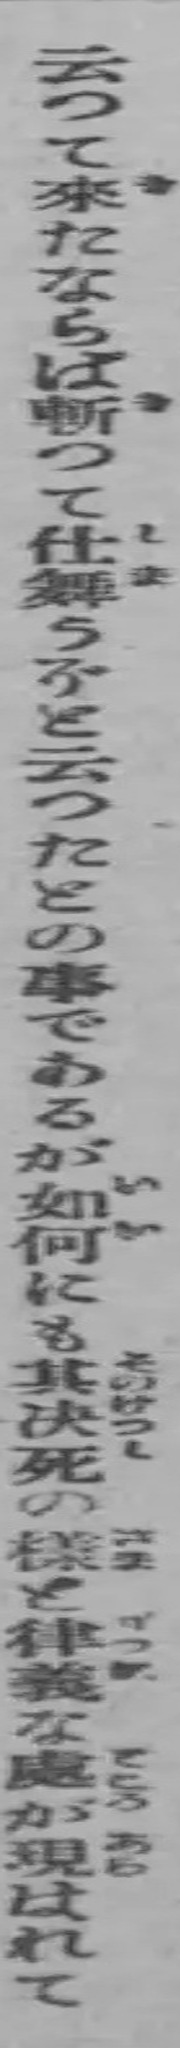云つて来たならば斬つて仕舞うぞと云つたとの事であるが如何にも其決死の様と律義な処が現はれて
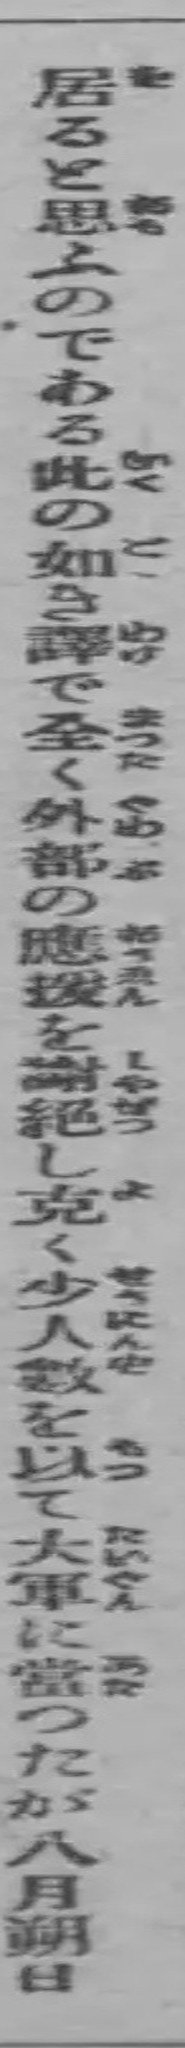居ると思ふのである此の如き訳で全く外部の応援を謝絶し克く少人数を以て大軍に当つたが八月朔日
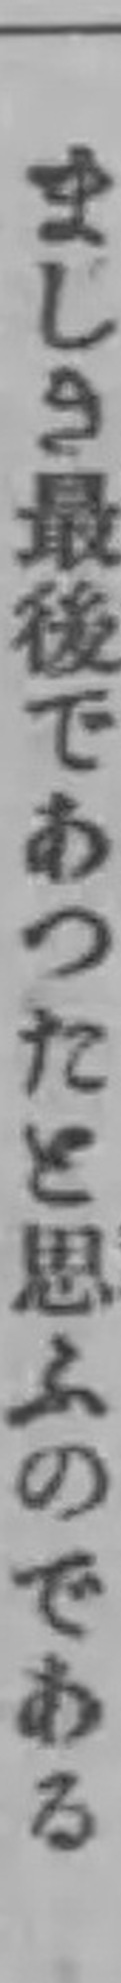ましき最後であつたと思ふのである
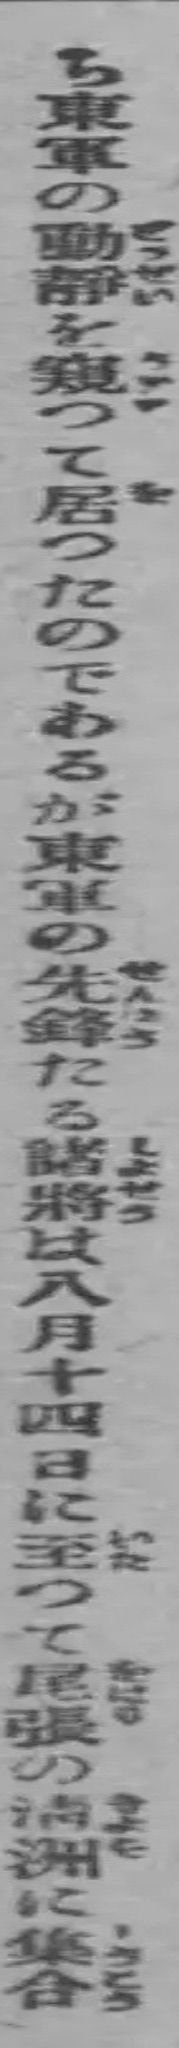すち東軍の動静を窺つて居つたのであるが東軍の先鋒たる諸将は八月十四日に至つて尾張の清洲に集合

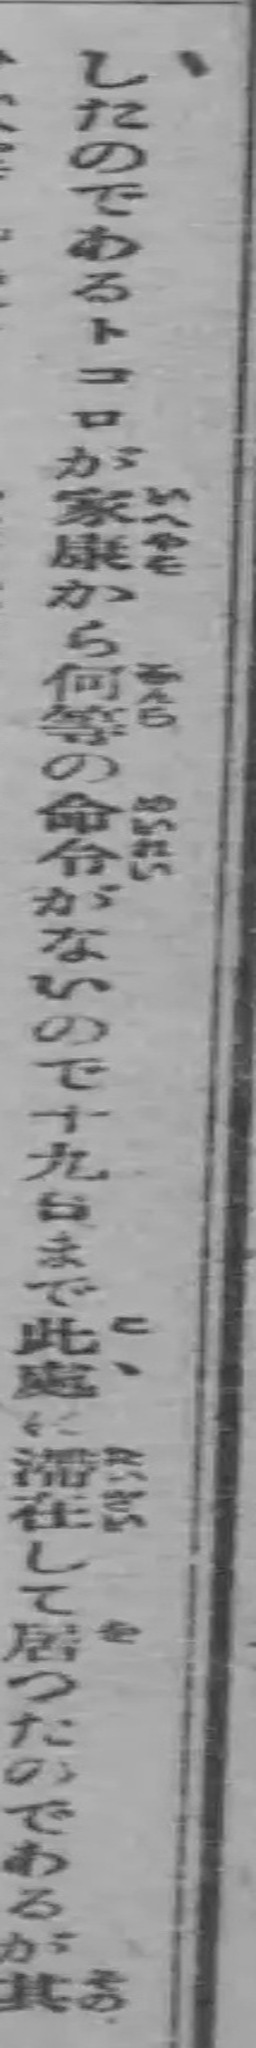したのであるトコロが家康から何等の命令がないので十九日まで此処に滞在して居つたのであるが其
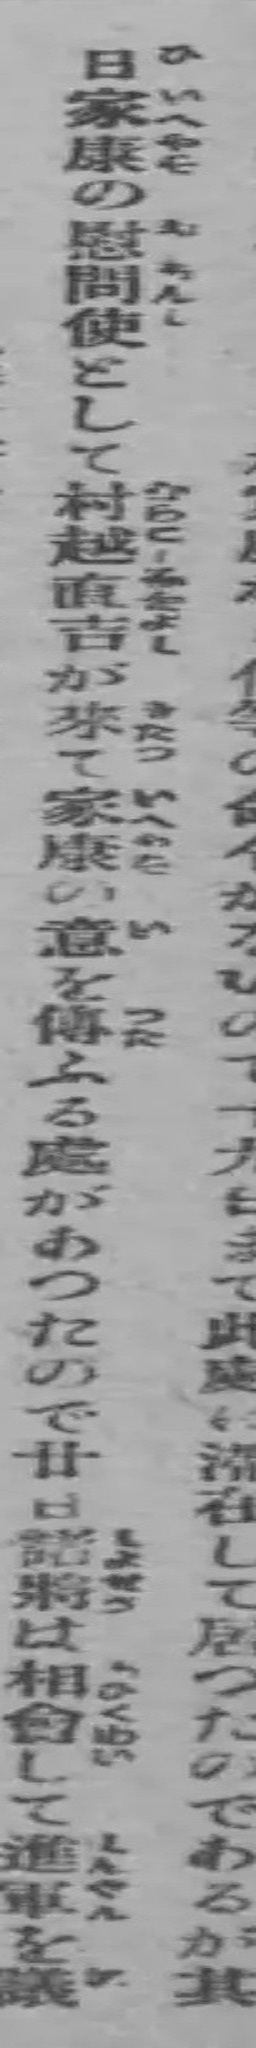日家康の慰問使として村越直吉が来て家康の意を伝ふる処があつたので廿日諸将は相会して進軍を議
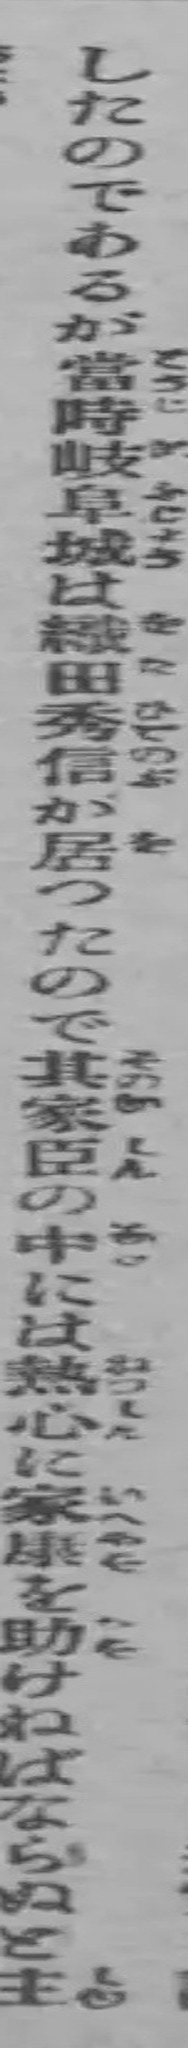したのであるが当時岐阜城は織田秀信が居つたので其家臣の中には熱心に家康を助けねばならぬと主
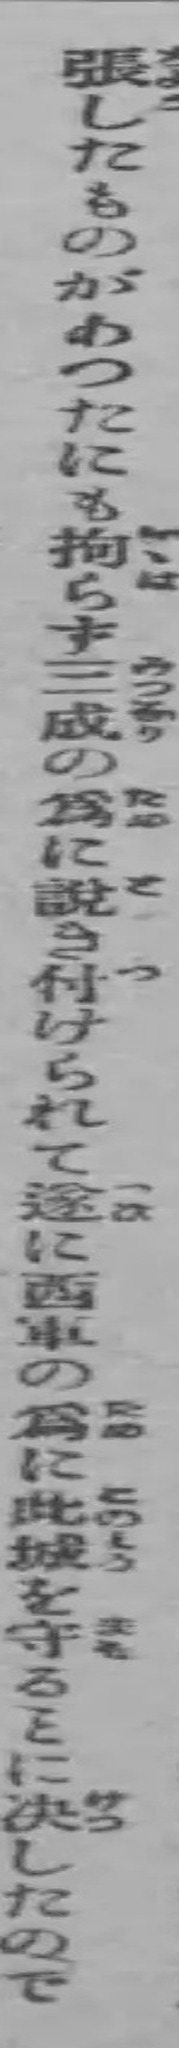張したものがあつたにも拘らず三成の為に説き付けられて遂に西軍の為に此城を守ることに決したので
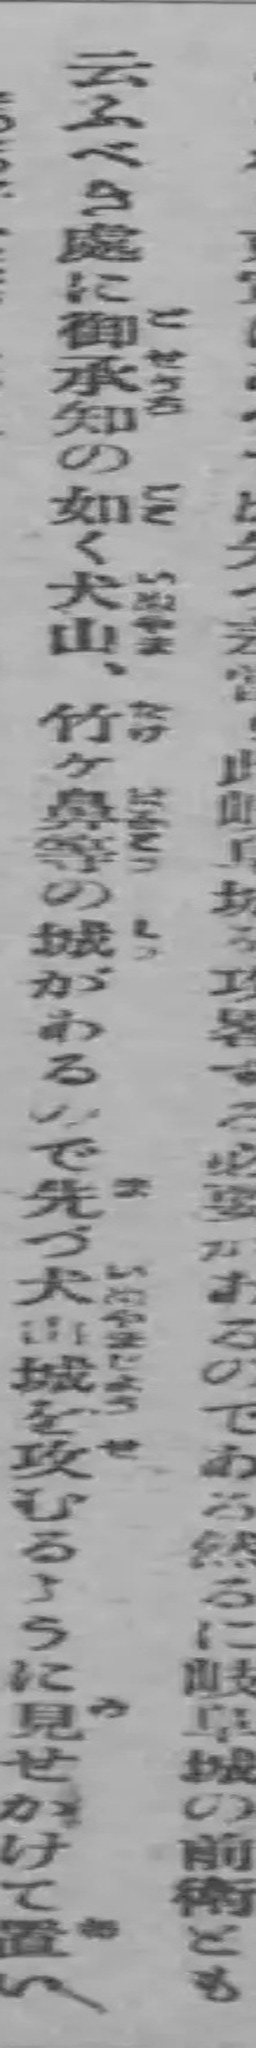云ふべき処に御承知の如く犬山、竹ケ鼻等の城があるので先づ犬山城を攻むるように見せかけて置い
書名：豊橋市史談
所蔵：国立国会図書館 National Diet Library, JAPAN
